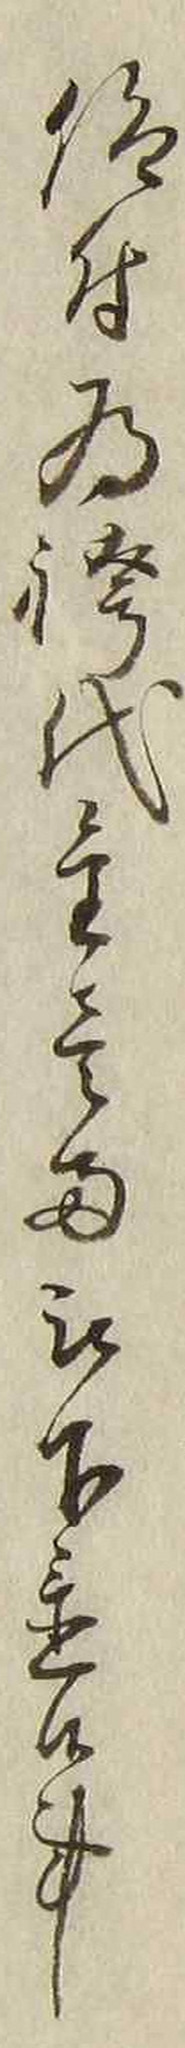仰付為袴代金壱両被下置候事
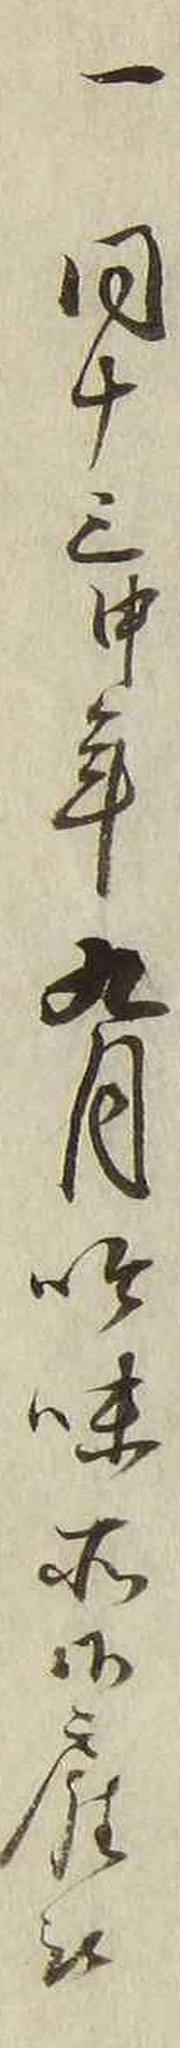一同十三申年九月吟味所御雇被

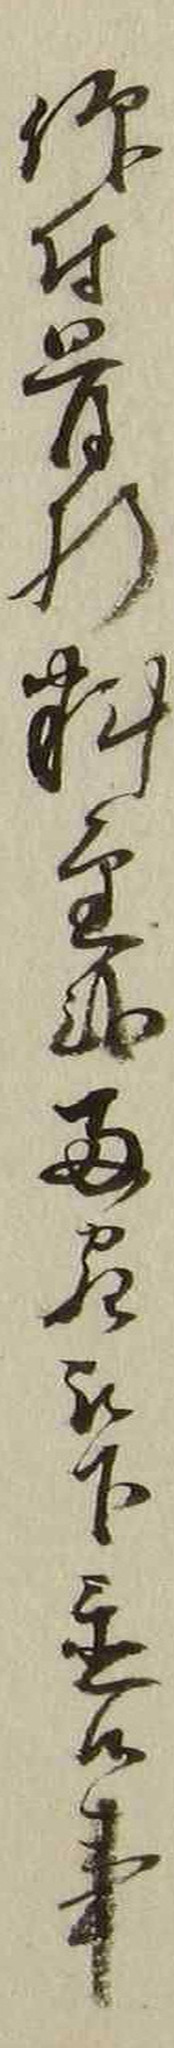仰付骨折料金弐両宛被下置候事
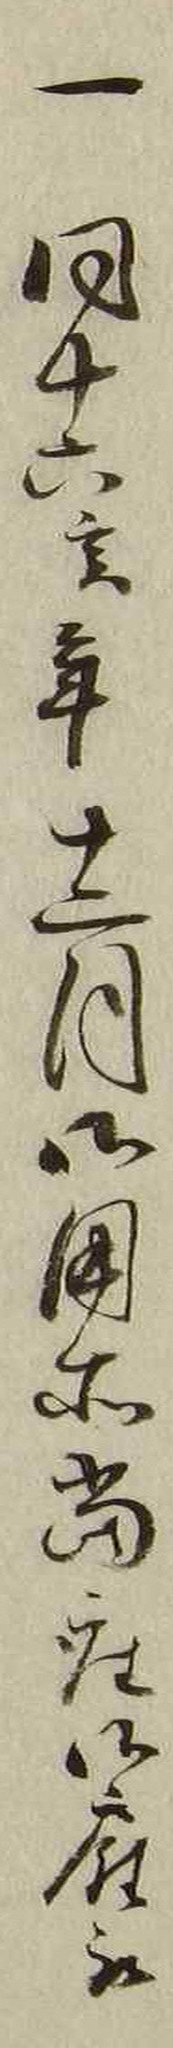一同十六亥年十二月御用所当座御雇被
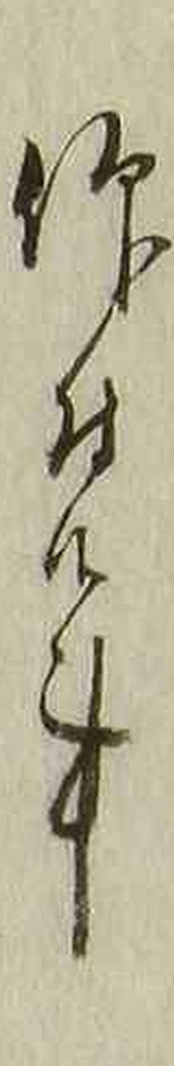仰付候事
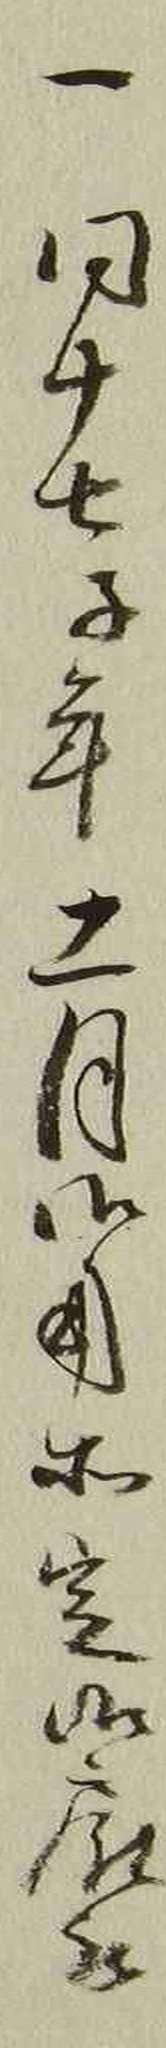一同十七子年十一月御用所定御雇被
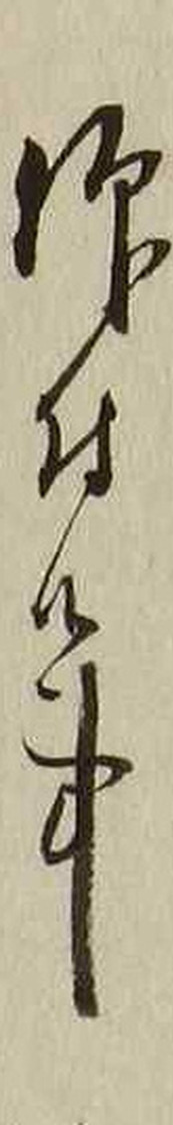仰付候事
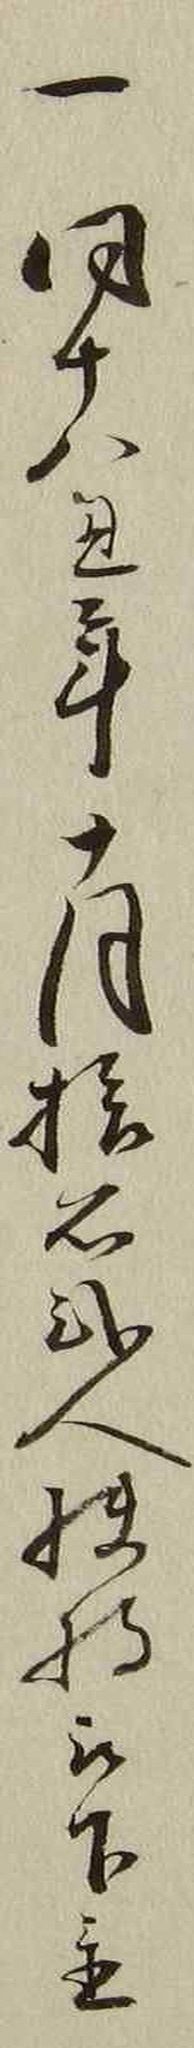一同十八丑年十月拾石弐人扶持被下置
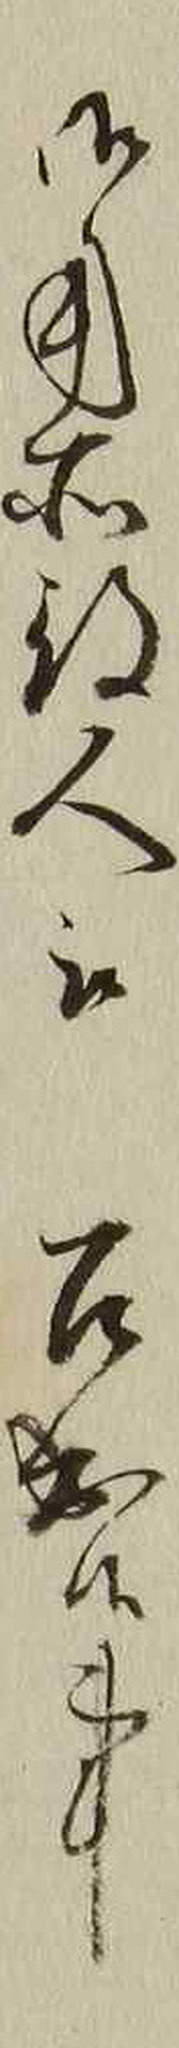御用所役人被召出候事
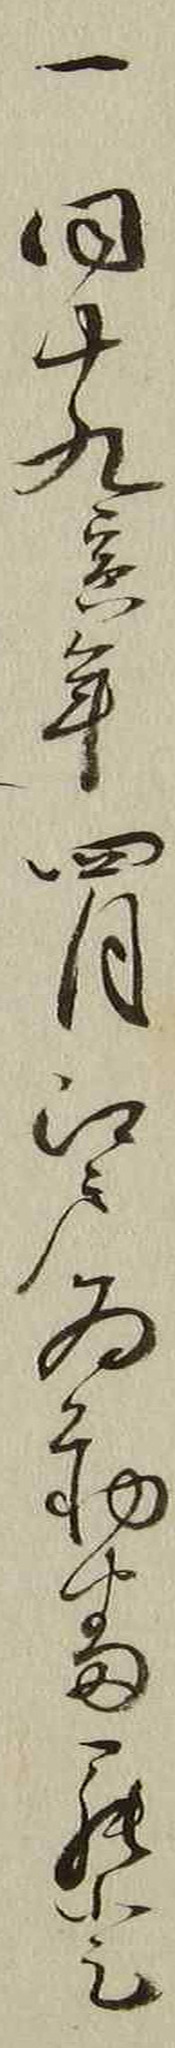一同十九寅年四月江戸為勤番罷登
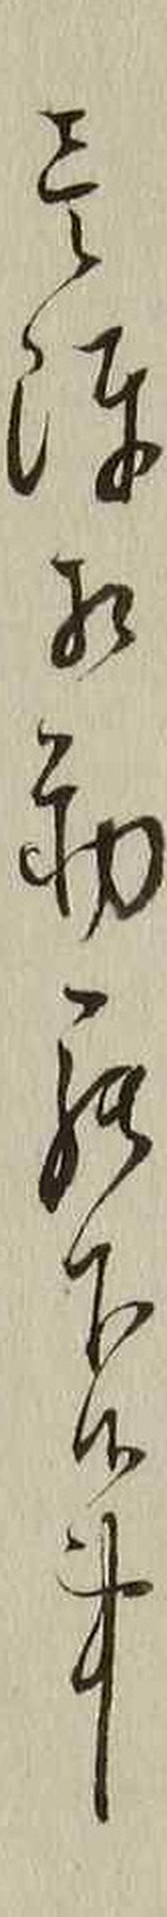壱陣相勤罷下候事
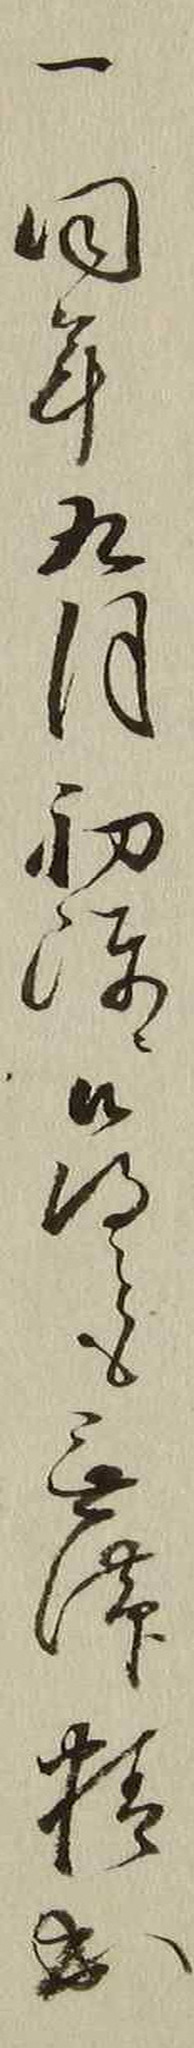一同年九月初陣ニ候得とも無滞精出
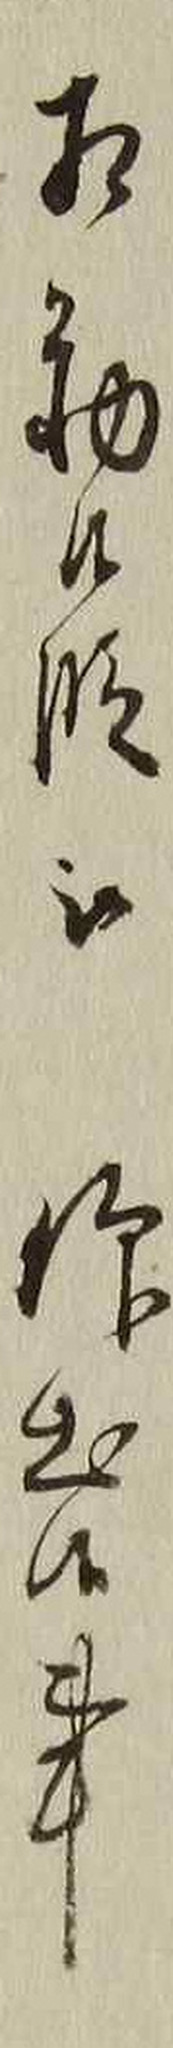相勤候段被仰出候事
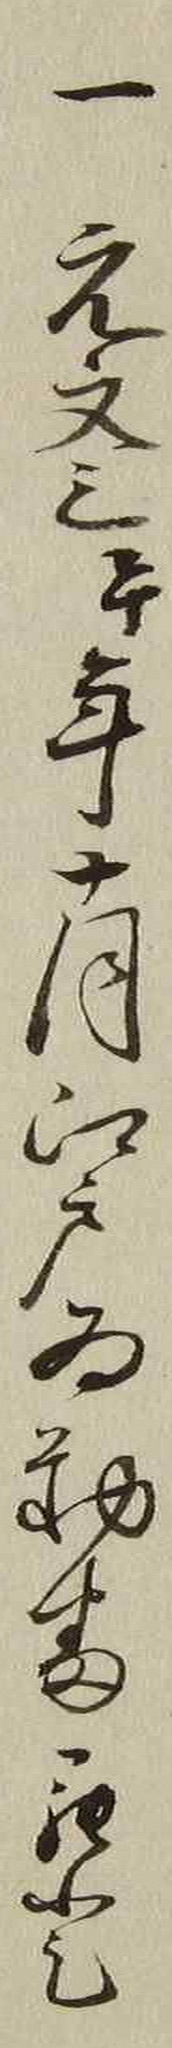一元文三午年十月江戸為勤番罷登
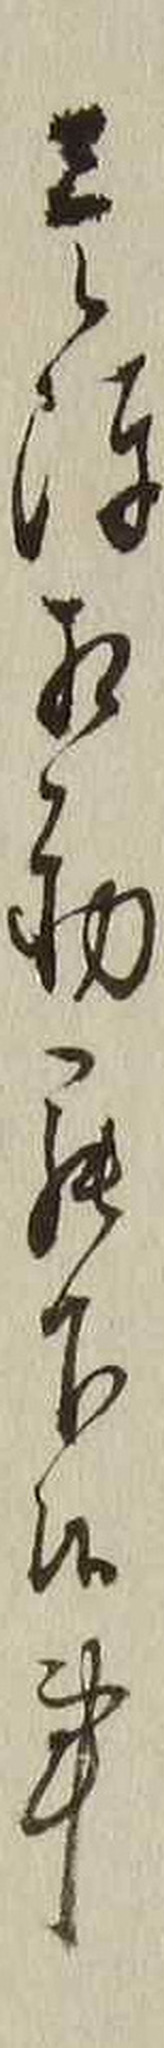壱陣相勤罷下候事
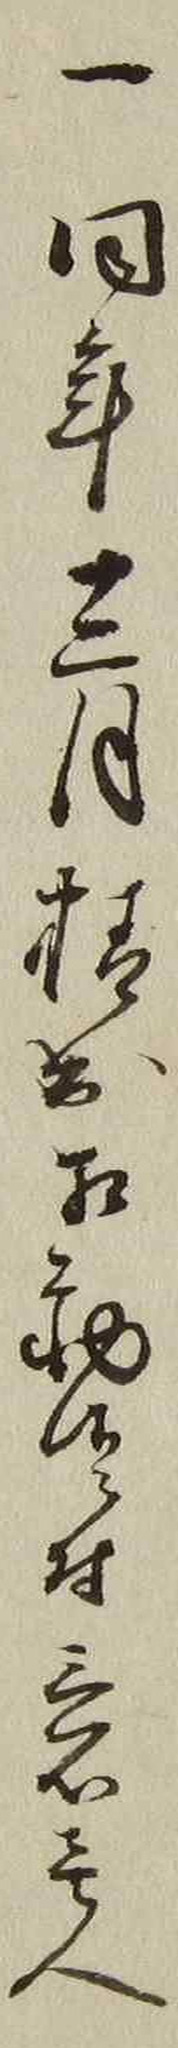一同年十二月精出相勤候ニ付三石壱人
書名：諸士系譜　巻之129　た之部5
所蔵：会津若松市立会津図書館
